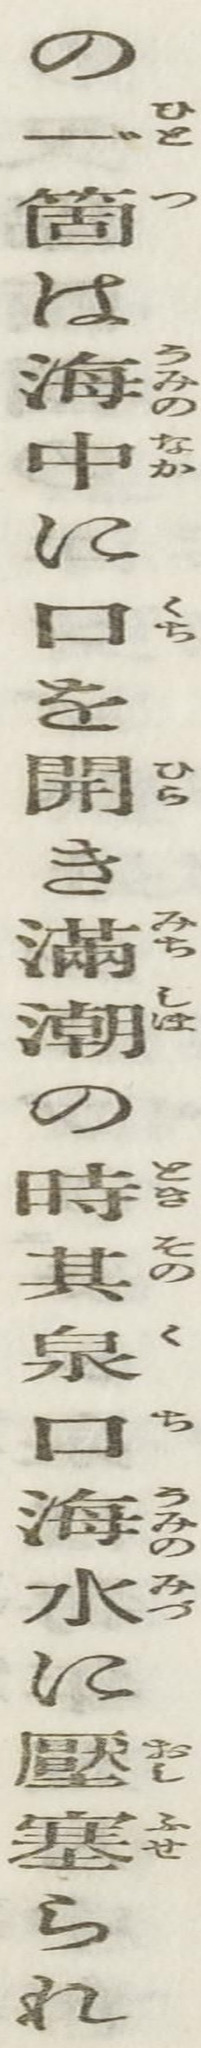の一箇は海中に口を開き満潮の時其泉口海水に厭塞られ
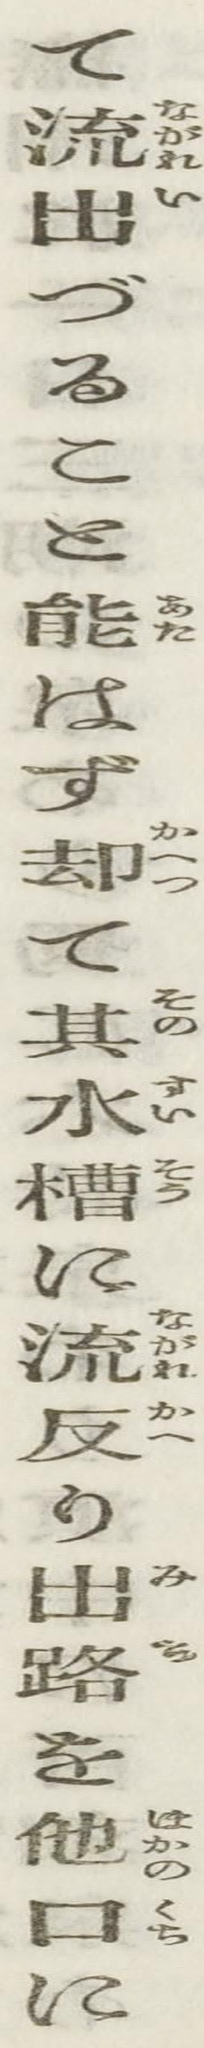て流出づること能はず却て其水槽に流反り出路を他口に
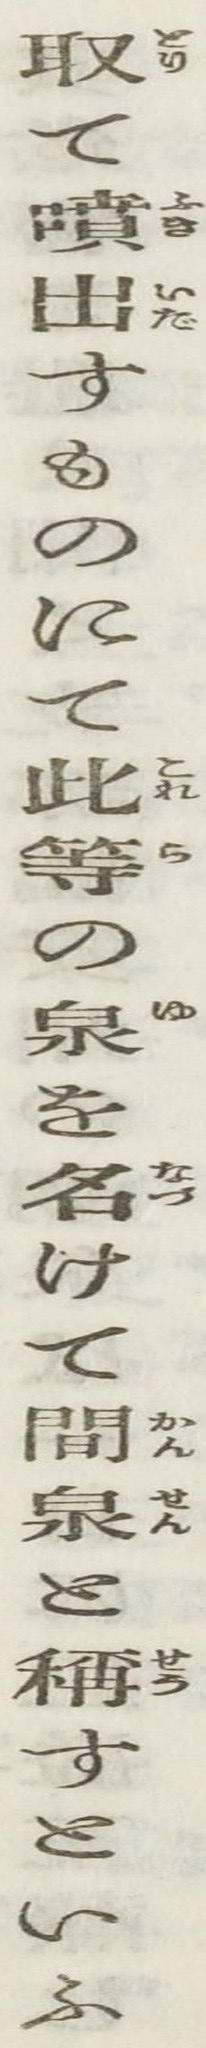取て噴出すものにて此等の泉を名けて間泉と称すといふ
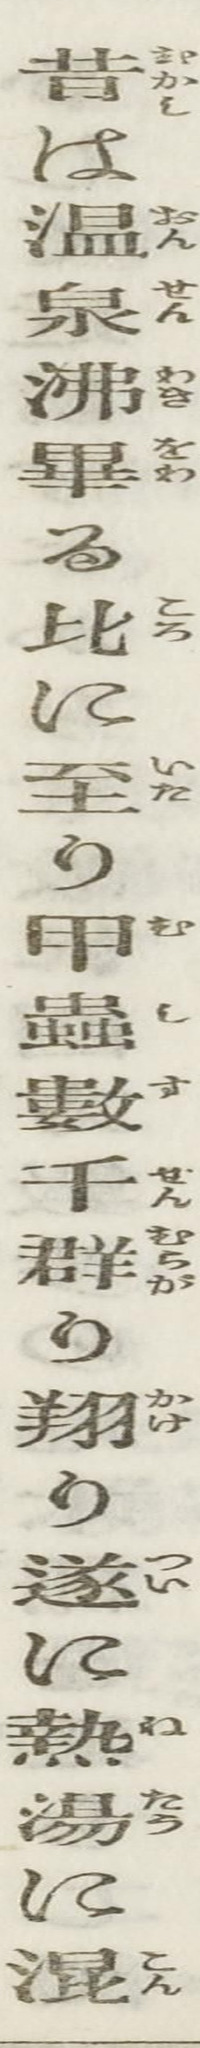昔は温泉沸畢る比に至り甲蟲数千群り翔り遂に熱湯に混
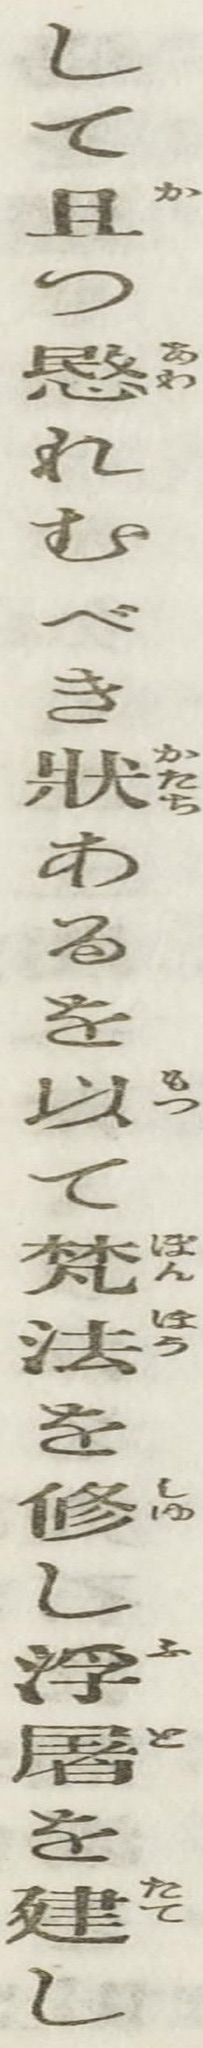して且つ愍れむべき状あるを以て梵法を修し浮屠を建し
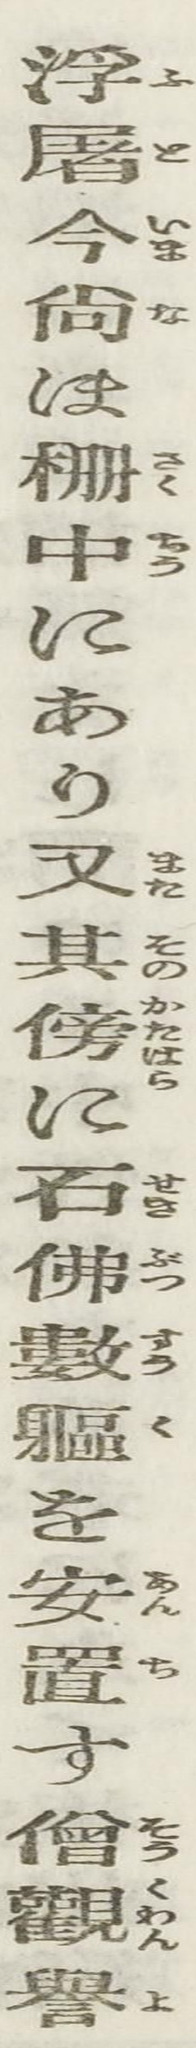浮屠今尚ほ柵中にあり又其傍に石佛数躯を安置す僧観譽
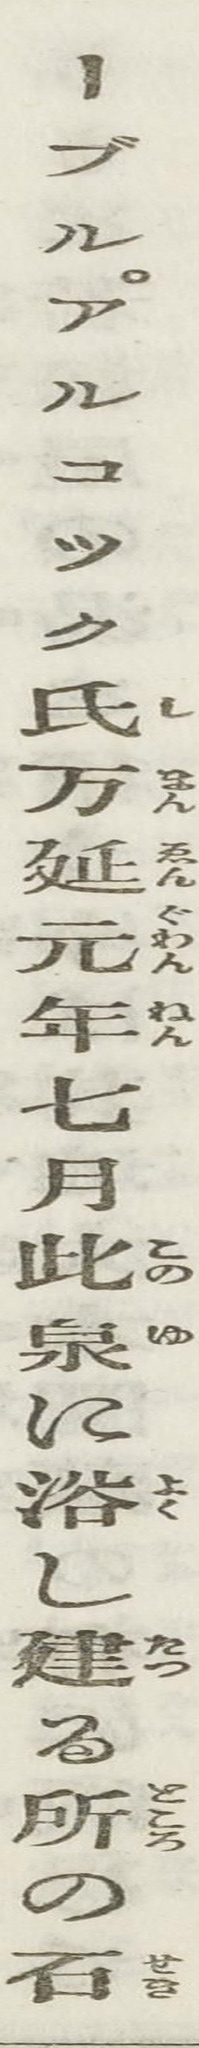ープル。アルコツク氏万延元年七月此泉に浴して建る所に石
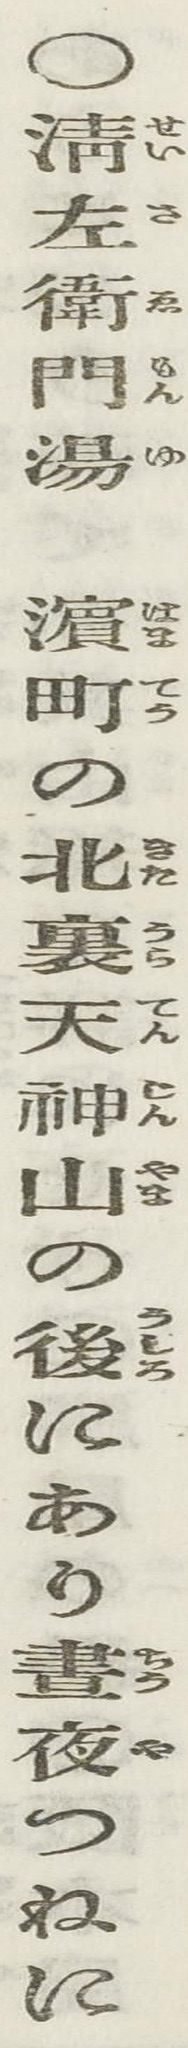○清左衛門湯浜町の北裏天神山の後にあり昼夜つねに
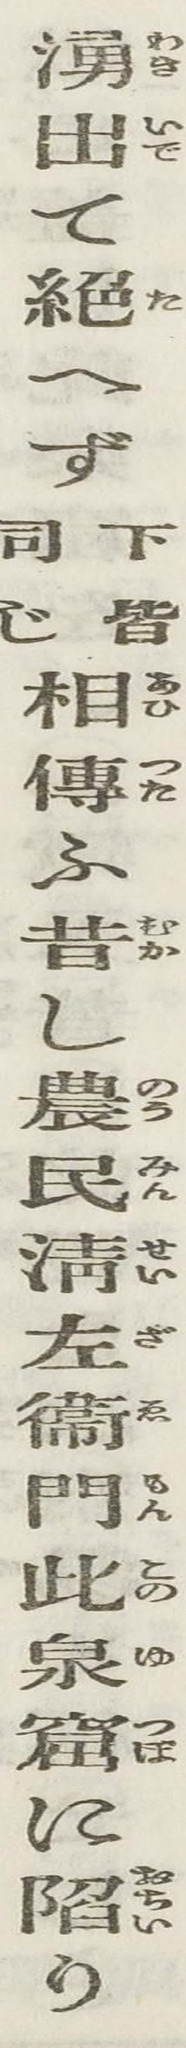湧出て絶へず下皆同じ相伝ふ昔し農民清左衛門此泉窟に陥り
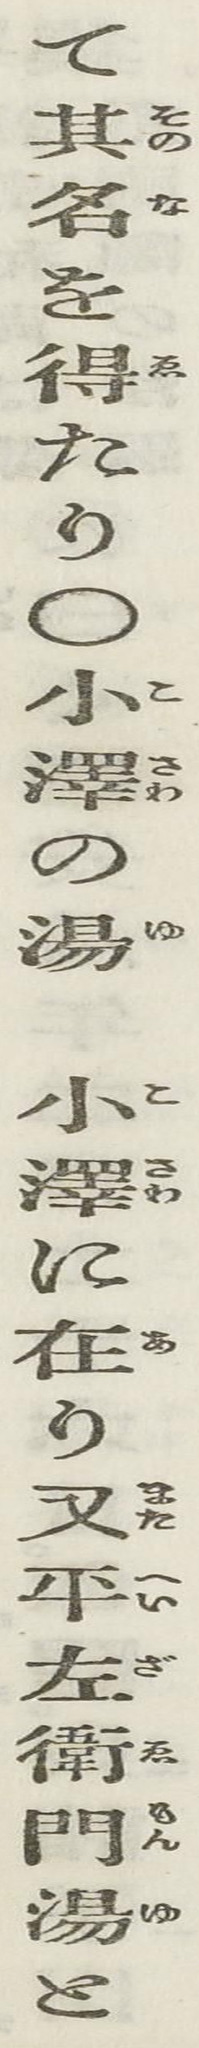て其名を得たり○小澤の湯小澤に在り又平左衛門湯と
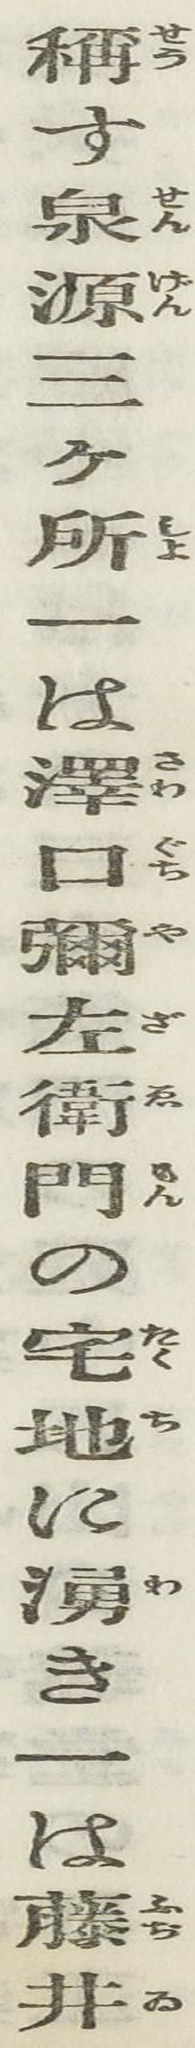称す泉源三ヶ所一は澤口弥左衛門の宅地に湧き一は藤井

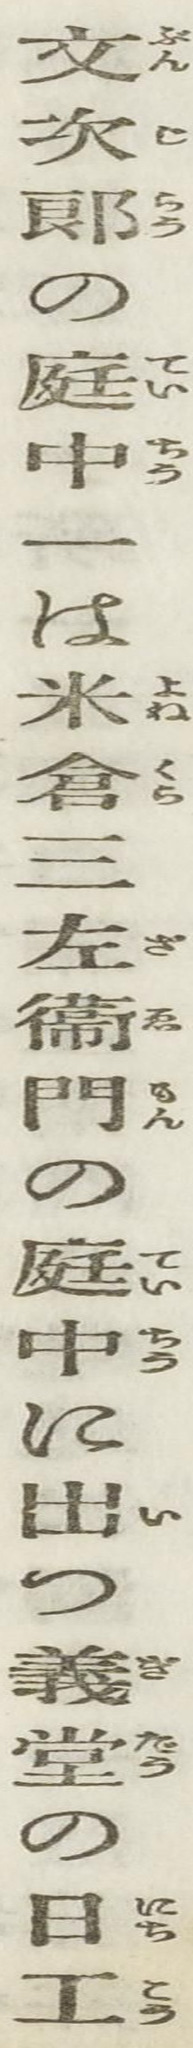文次郎の庭中一は米倉三左衛門の庭中に出つ義堂の日工
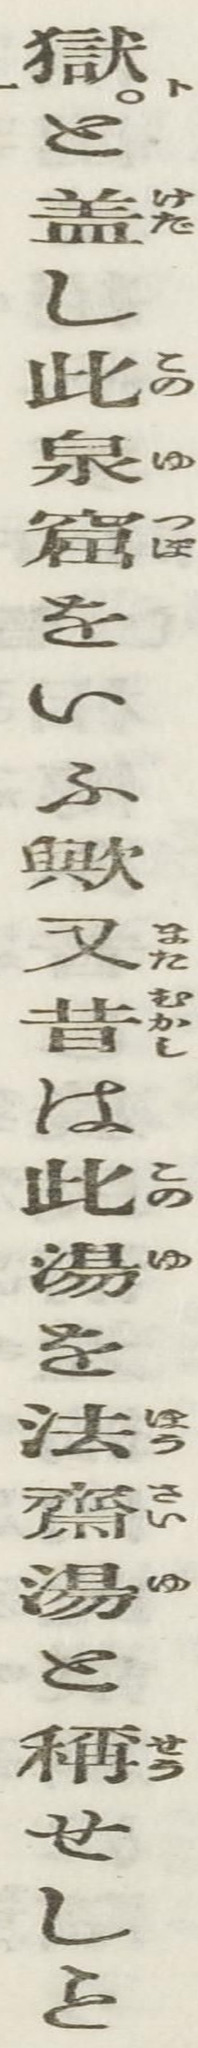獄蓋し此泉窟をいふ歟又昔は此湯を法齋湯と称せしと
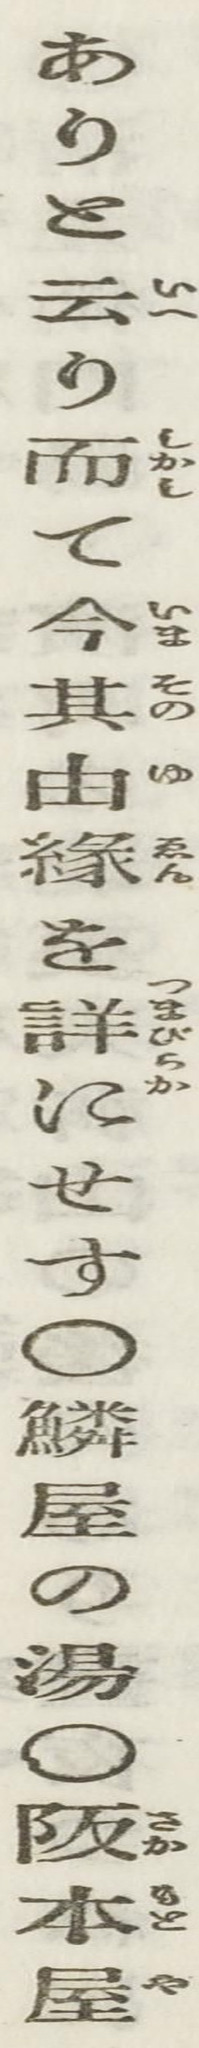ありと云り而て今其由縁を詳にせす○鱗屋の湯○阪本屋
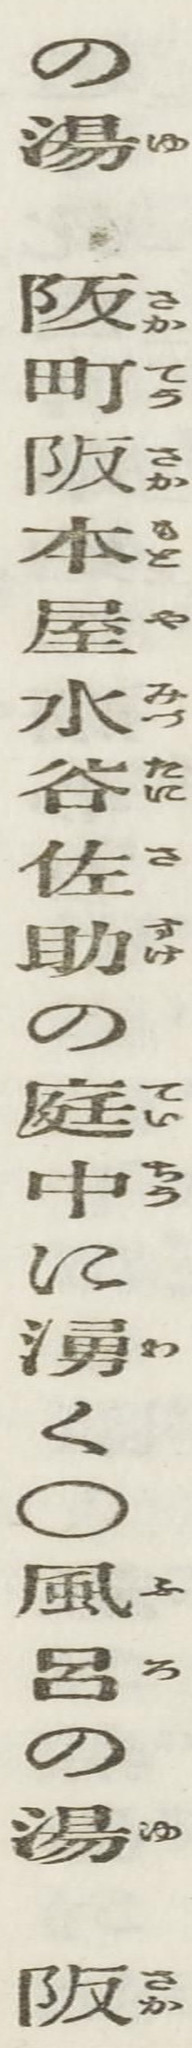の湯阪町阪本屋水谷佐助の庭中に湧く○風呂の湯阪
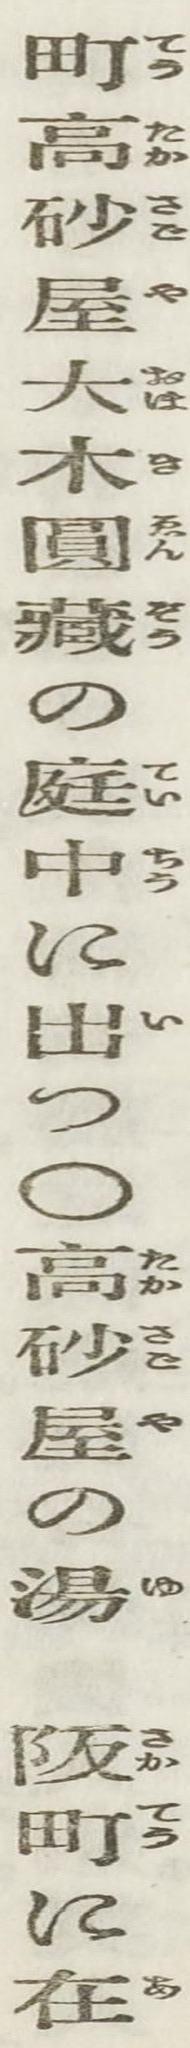町高砂屋大木圓蔵の庭中に出つ○高砂屋の湯阪町に在
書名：熱海獨案内　全
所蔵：東京大学地震研究所図書室 Earthquake Research Institute Library, The University of Tokyo, JAPAN
